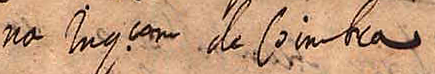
na Inq.cam de Coimbra
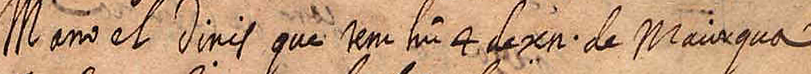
Manoel dinis que tem hū 4 de xn de Maiorqua
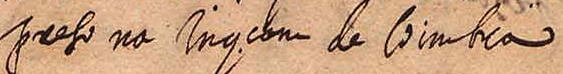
preso na Inq.cam de Coimbra
